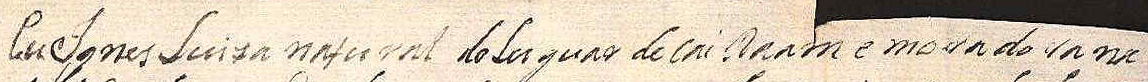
Eu Ignes Luiza natural do luguar de caiRaam e moradora na
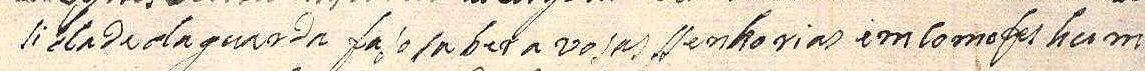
sidade da guarda faso saber a vosas ssenhorias em como fes hum
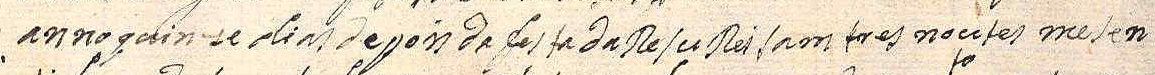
anno quinze dias depois da festa da ResuReisam tres noutes me sen
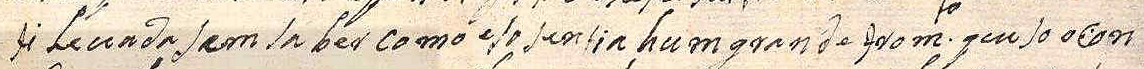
ti Leuada sam saber como e so sentia hum grande trom.to que so o con
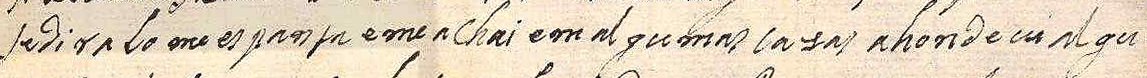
sedira lo me espanta e me achai em algumas casas ahonde ui algu
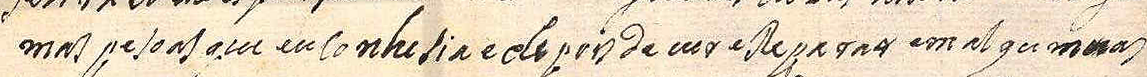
mas pesoas que eu conhesia e depois de uir e Reparar em algumaas
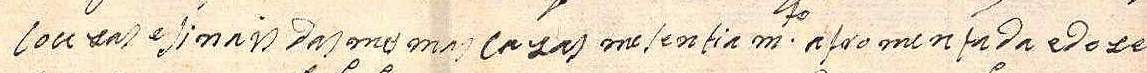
couzas e sinais das mesmas cazas me sentia m.to atromentada e doze
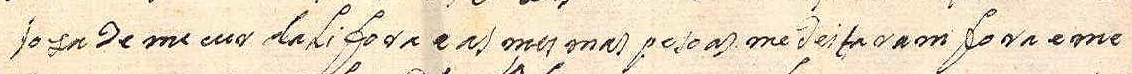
joza de me uer dali fora e as mesmas pesoas me deitaram fora e me
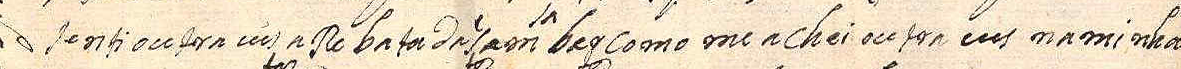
senti outra ues aRebatada sam saber como me achei outra ues na minha
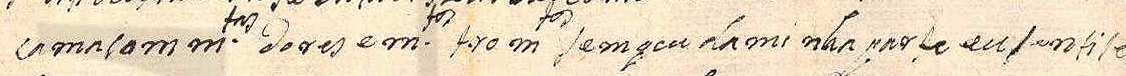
cama com m.tas dores e m.to tromtos sem qeu da minha parte eu santise
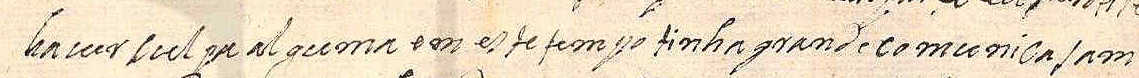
hauer culpa alguma em este tempo tinha grande comunicasam
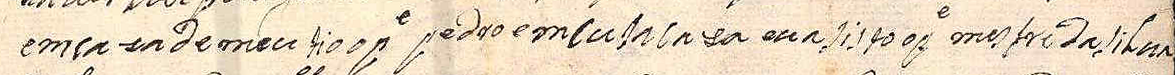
em caza de meu tio o pe pedro em cuja caza eu asisto o pe mestre da silua
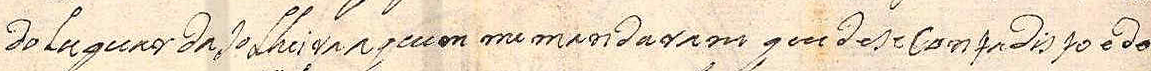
do Luguar da solheira a quem me mandaram que dese conta disto e do
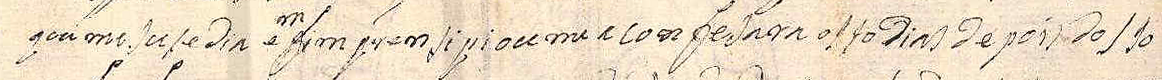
que me susedia emfim prensipioume a confesar a ojto dias depois de s jo
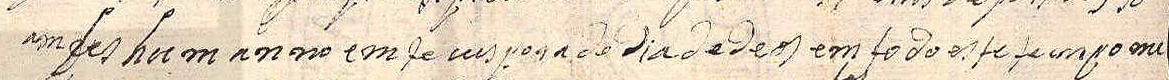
am fes hum anno emte uespora de dia de deos em todo este teempo me
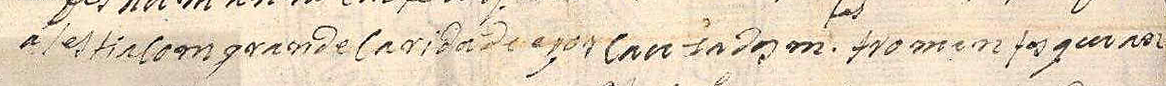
asestia com grande caridade e por cauza dos m.tos tromentos que an
